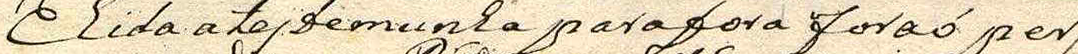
E hida a testemunha para fora foraõ per
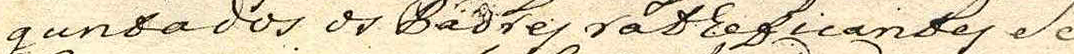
guntados os Padres ratheficantes Se
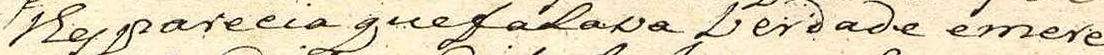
lhes parecia que falava Verdade e mere
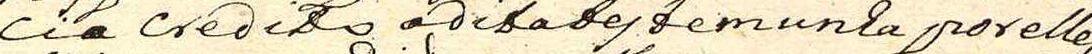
cia credito a dita testemunha por elles
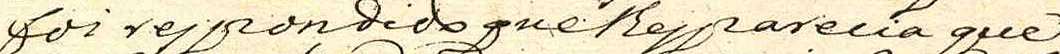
foi respondido que lhes parecia que
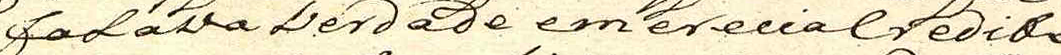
falava Verdade e merecia Credito
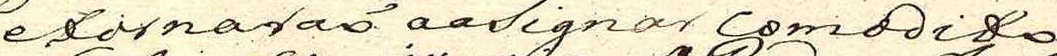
e tornaraõ a asignar com o dito
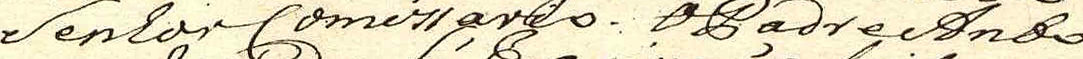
Senhor Comissario. O Padre Anto
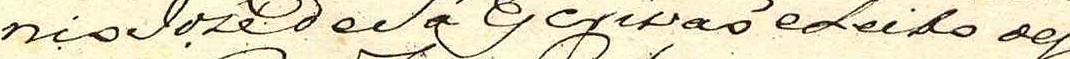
nio Iozé de Sá Escrivaõ eLeito o es
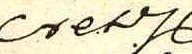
crevj
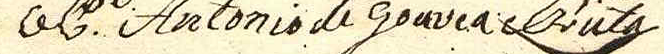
O P.e Antonio de Gouvea e Freitas
